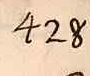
428
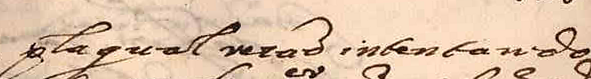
pla qual rezaõ intentando
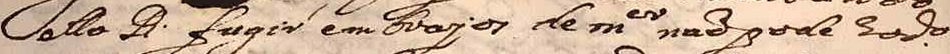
ella R. fugir em trajos de mer naõ pode E o d.o
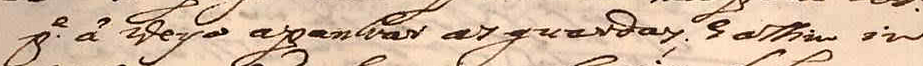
p.e á veyo apanhar as guardas. E assim in
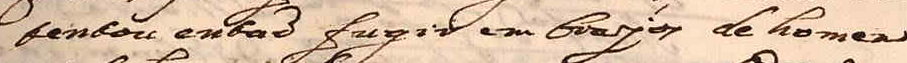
tentou entaõ fugir em trajos de homem
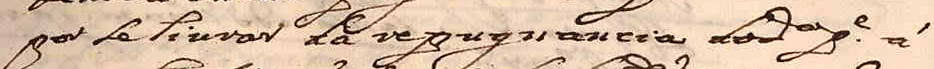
por se liurar da repugnancia do do p.e á
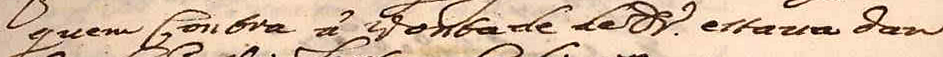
quem Contra á vontade de Dr.o estaua dan
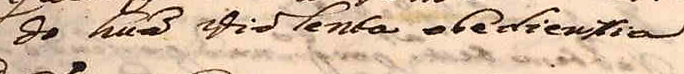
do huā violenta obedienssia
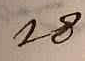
28
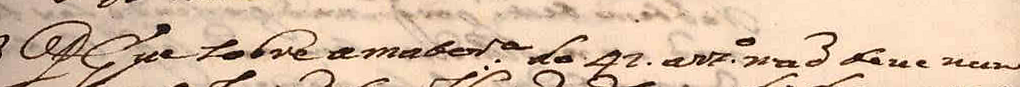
P Que sobre a mater.a de 42. art.o naõ teue nun
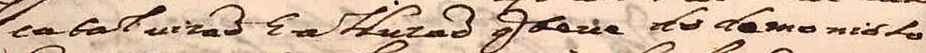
ca tal uizaõ E a Iluzaõ q̄ teue do demonio so
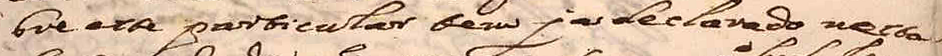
bre este particular bem ja declarado nesta
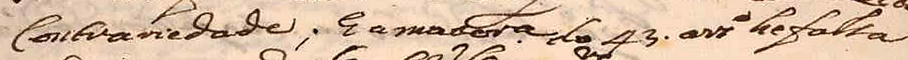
Contrariedade; E a mater.a do 43. art.o he falsa
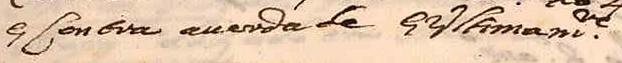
e Contra a uerdade E Vltimam.te
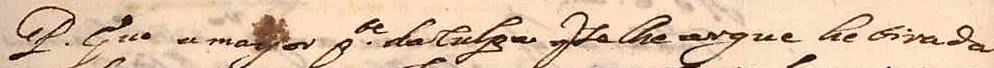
P. Que a mayor p.te da culpa q̄ se lhe argue he tirada
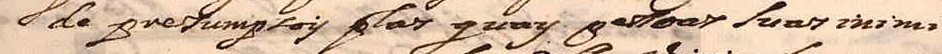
de presumpsois p̄las quais pessoas suas inimi
